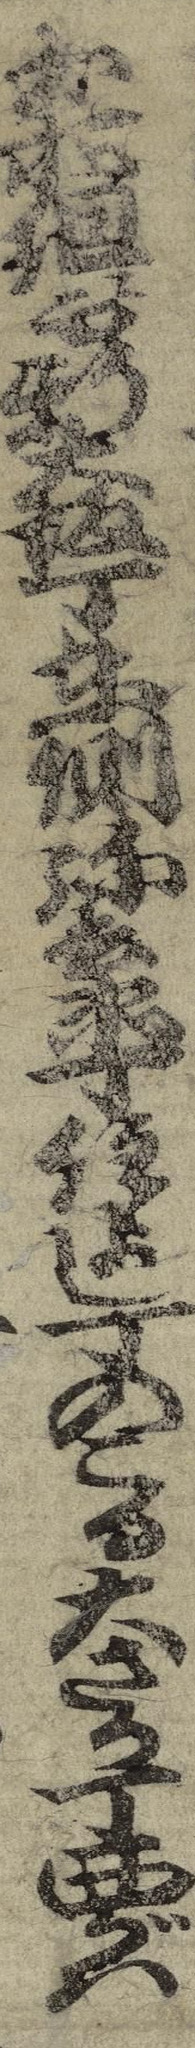拾組に而新大坂丁東側弥兵衛丁住よし丁のこる大さか丁西がは
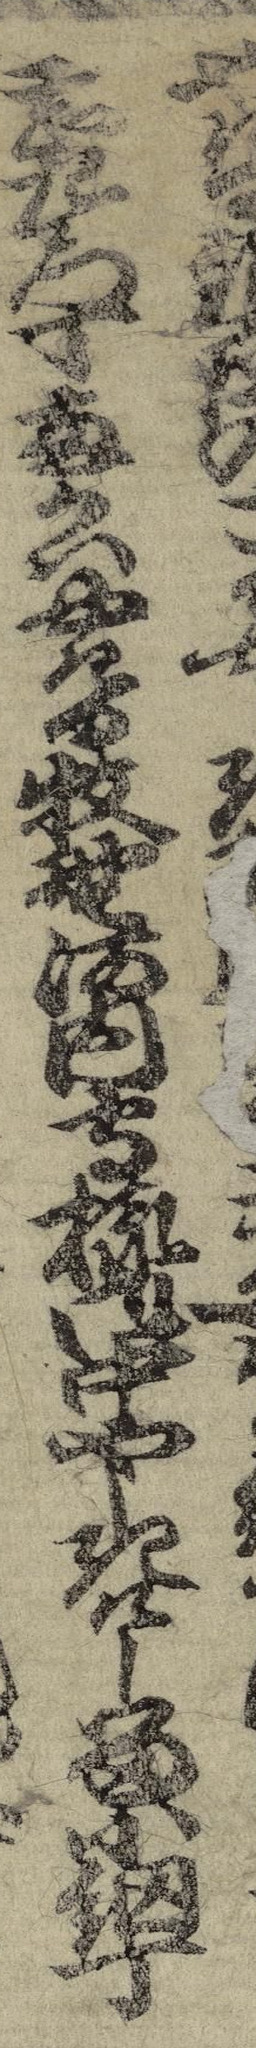甚左衛門丁南かはやける牧野河内守様御中やしきけし留小網丁
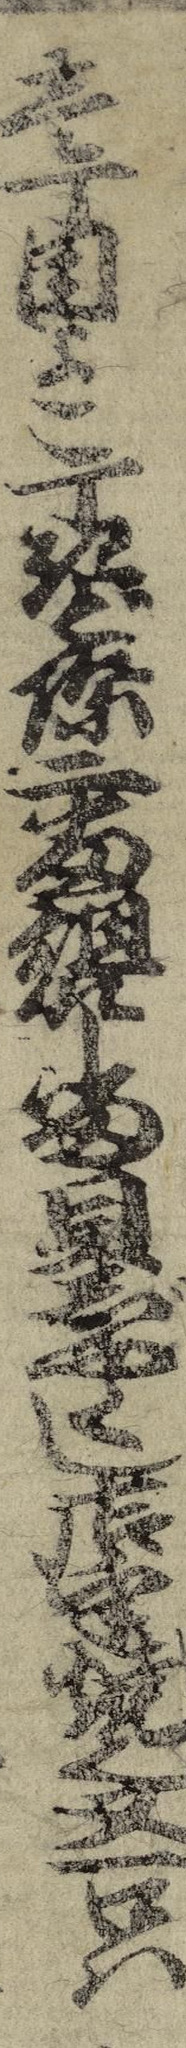壱丁目よこ丁原二番組けし留貝じやくし店半焼也又一口は
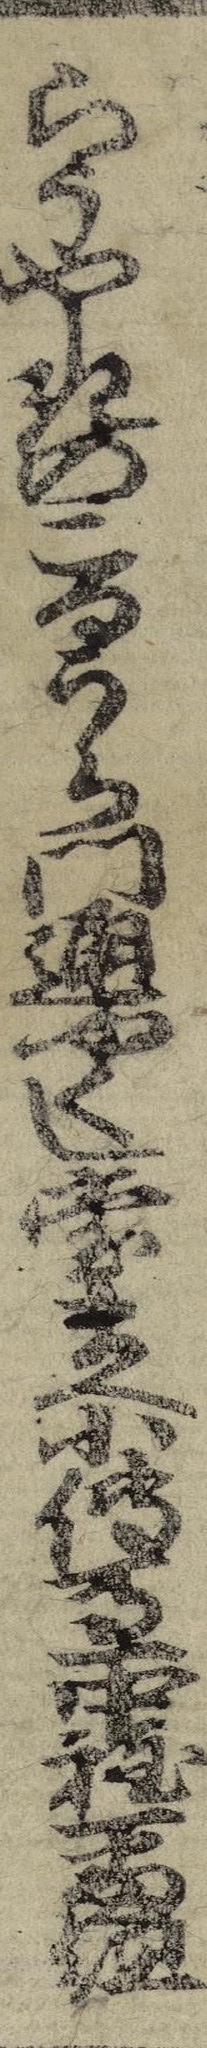らうやしきのこるうら門通やくし堂まへ小伝馬丁中程一番組
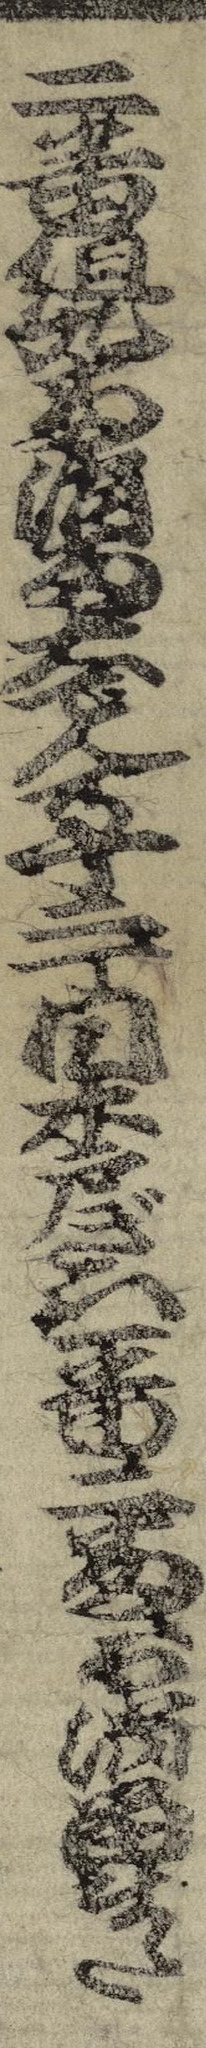二番組九番消留大でん馬丁二丁目木戸ぎは一番二番二而消留また
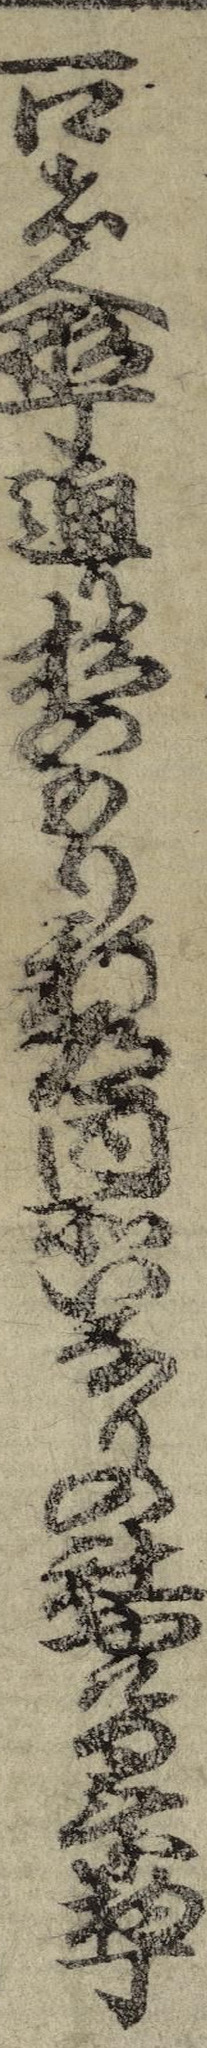一口は人形丁通り杉のもり新道内所いなりの社やける乗物丁
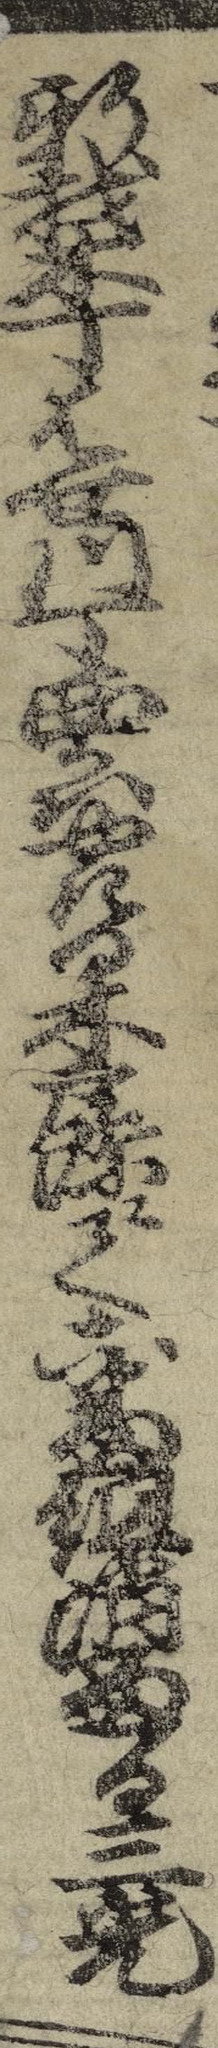新材木丁はせ川丁西かはやける木戸際にて六番組消留る三光
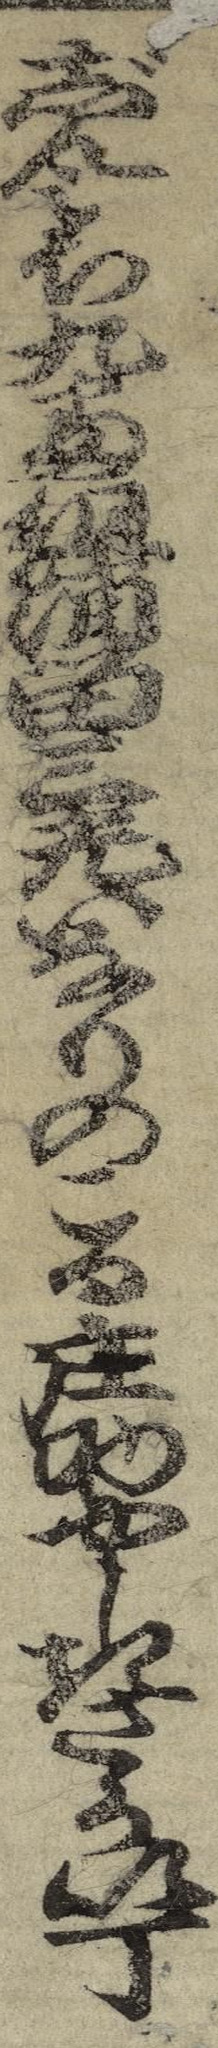じんち九番組消留三光いなりのこる庄助やしきさかい丁
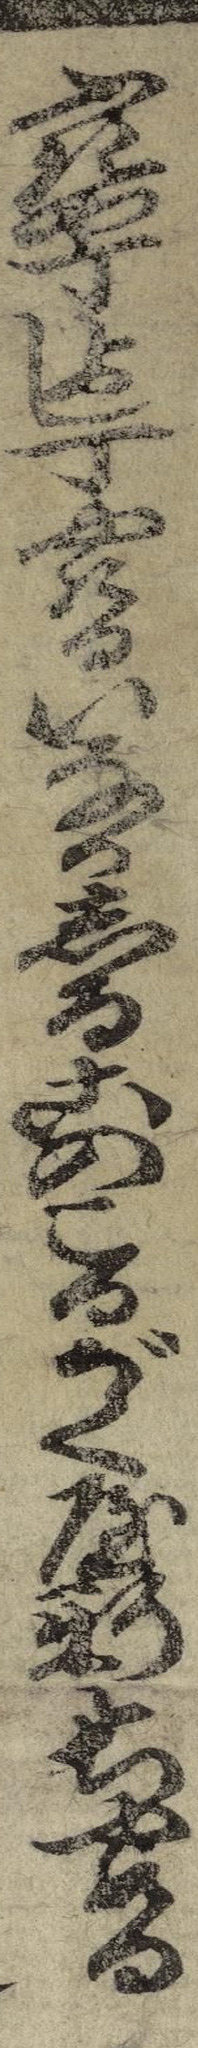ふきや丁よし丁やけるいなかしるこのこるがく屋新ちやける
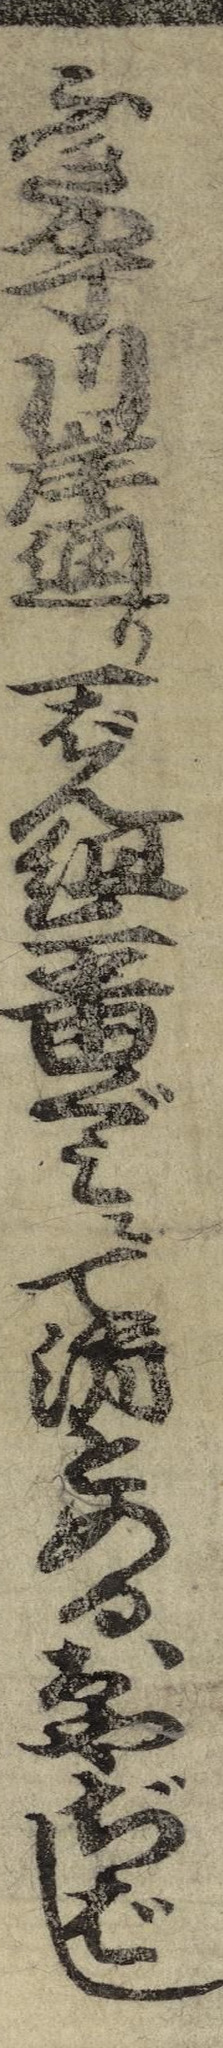ふきや丁川岸通り一ばん組二番ぐみにて消とめるおやぢばし
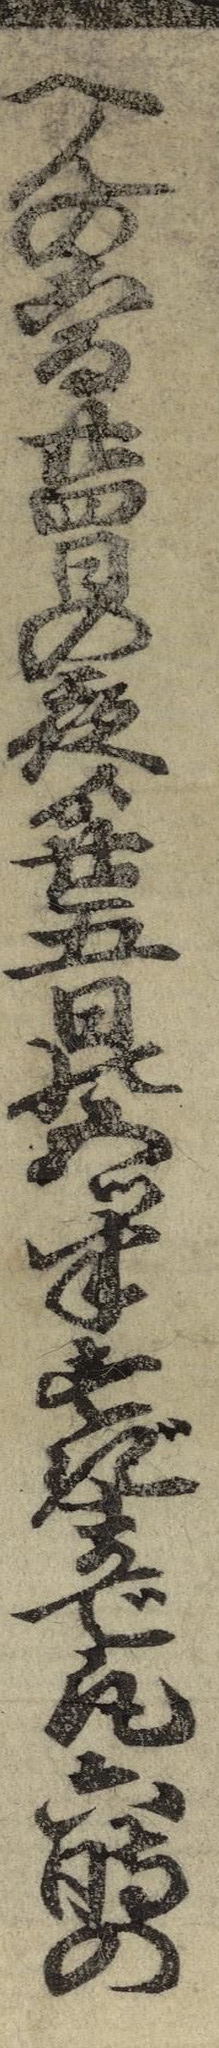へんのこる廿四日の夜ゟ廿五日の五ツ半すぎまで凡六時の
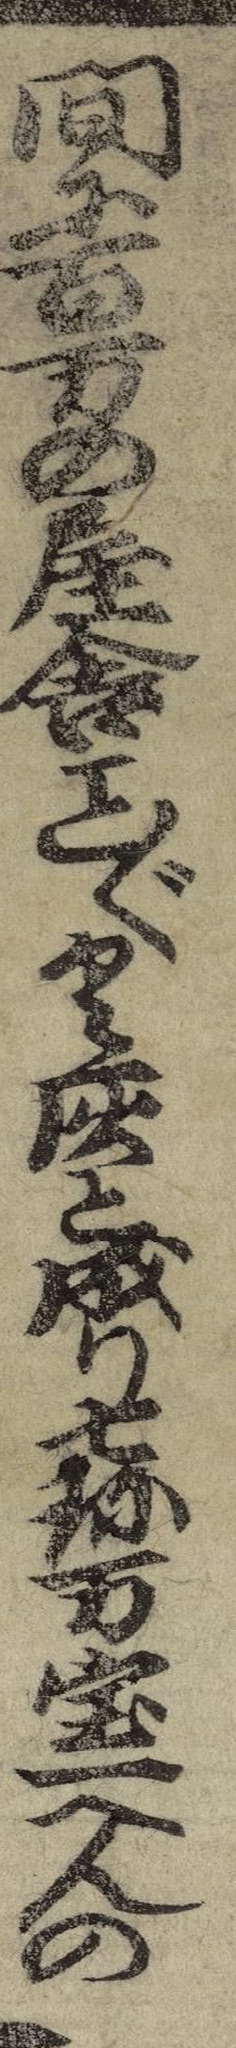間に百万の屋舎こと〴〵く灰と成り七珎万宝一へんの
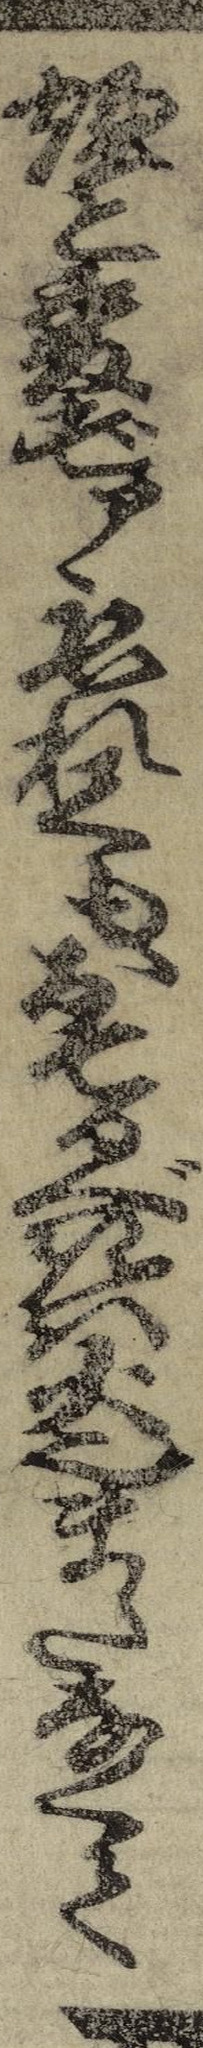煙と変ずれてもおそるべきは火也またなくて
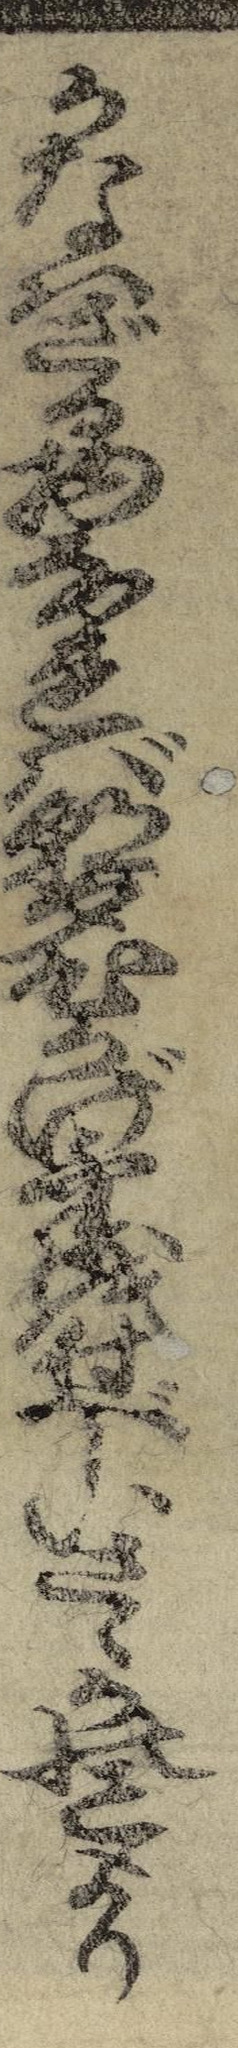かなはざる物なれば朝夕心かげ中を付べしいさゝかのことより
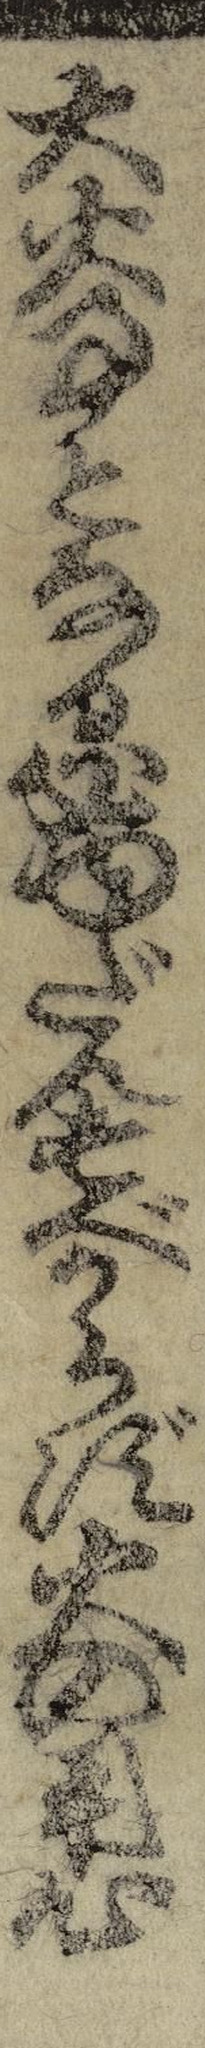大火事となる故ゆだんすべからず火の用心
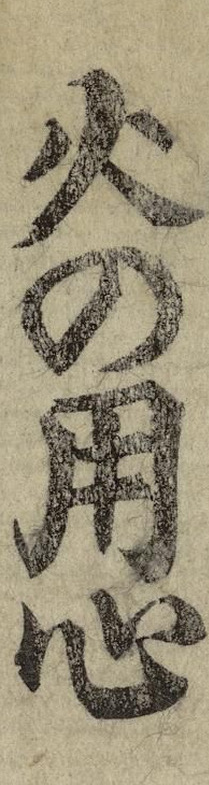火の用心
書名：焼場獨案内
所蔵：東京大学地震研究所図書室 Earthquake Research Institute Library, The University of Tokyo, JAPAN
